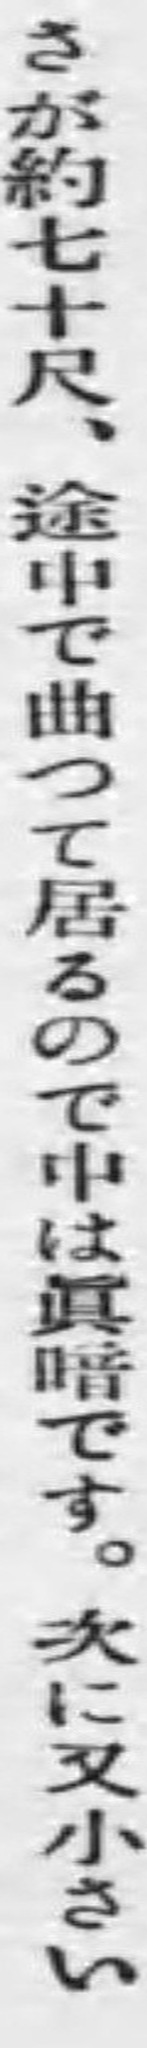さが約七十尺、途中で曲つて居るので中は眞暗です。次に又小さい
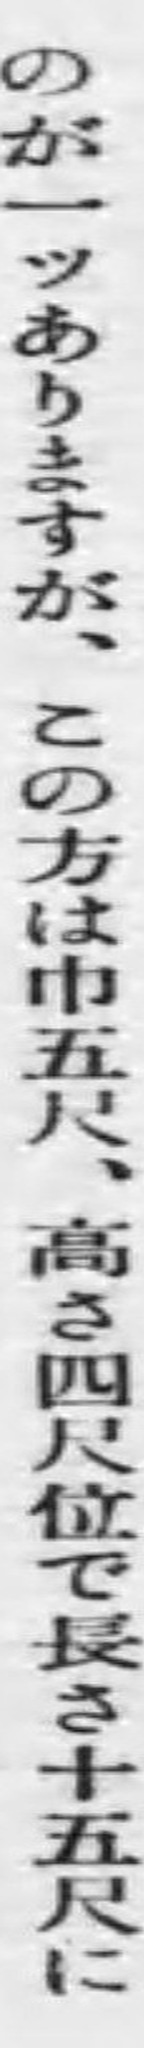のが一ツありますが、この方は巾五尺、高さ四尺位で長さ十五尺に
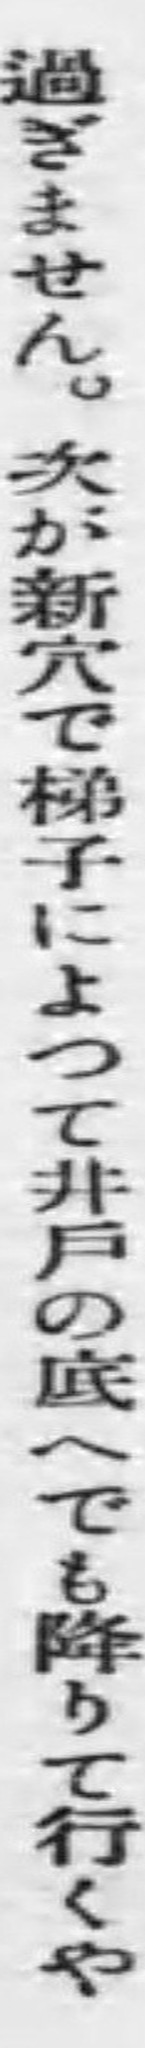過ぎません。次が新穴で梯子によつて井戸の底へでも降りて行くや
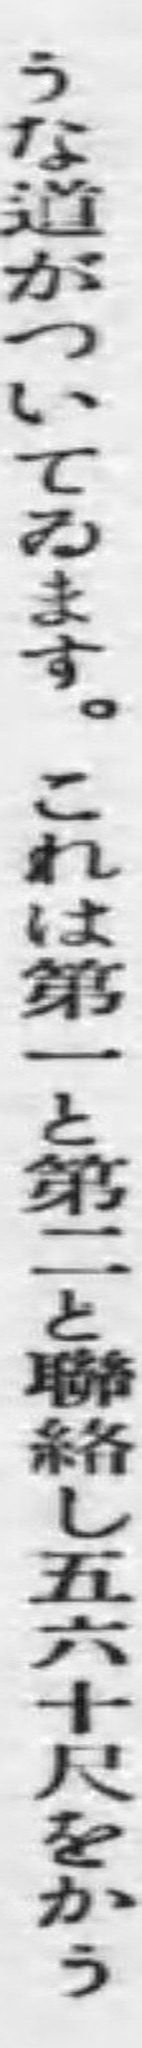うな道がついてゐます。これは第一と第二と聯絡し五六十尺をかう
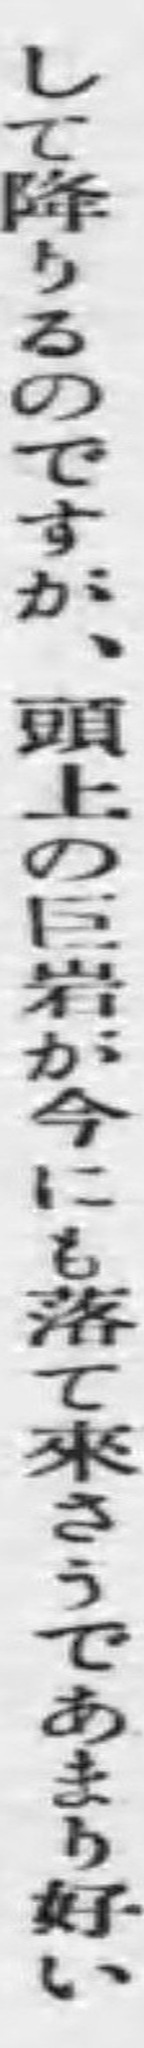して降りるのですが、頭上の巨岩が今にも落て來さうであまり好い
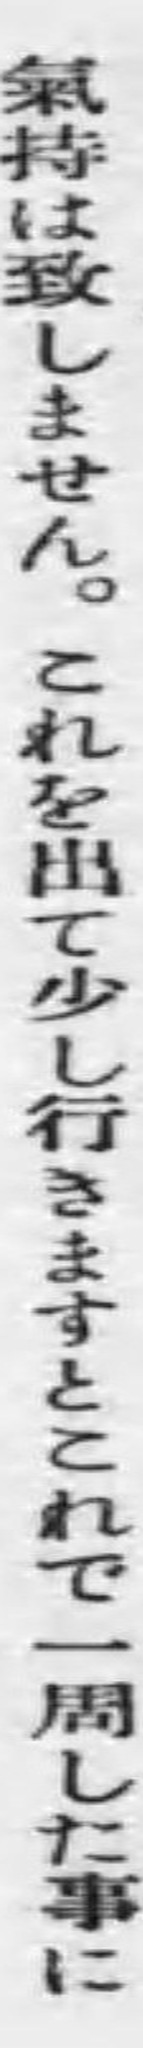氣持は致しません。これを出て少し行きますとこれで一周した事に

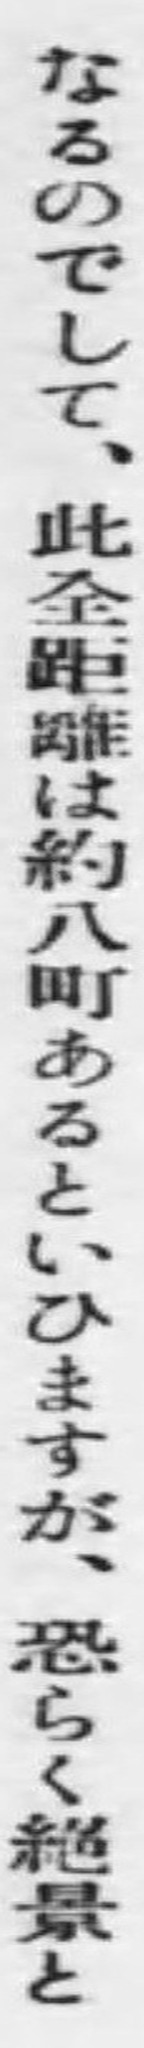なるのでして、此全距離は約八町あるといひますが、恐らく絶景と
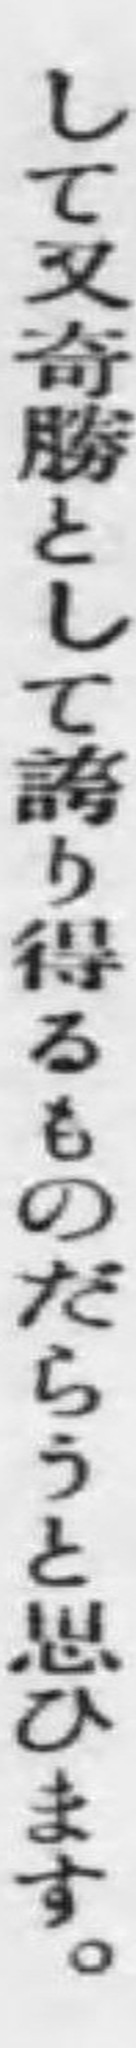して又奇勝として誇り得るものだらうと思ひます。
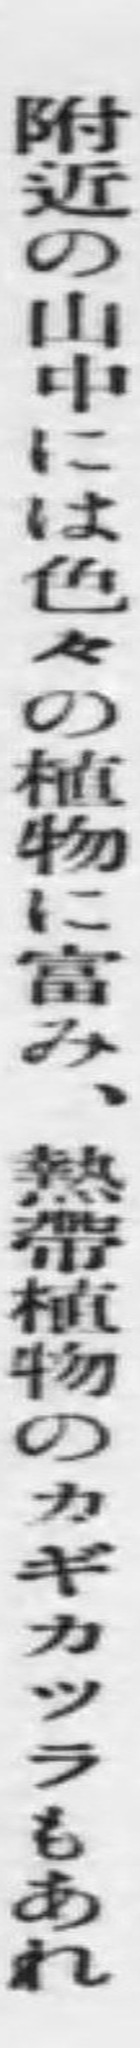附近の山中には色々の植物に富み、熱帯植物のカギカツラもあれ
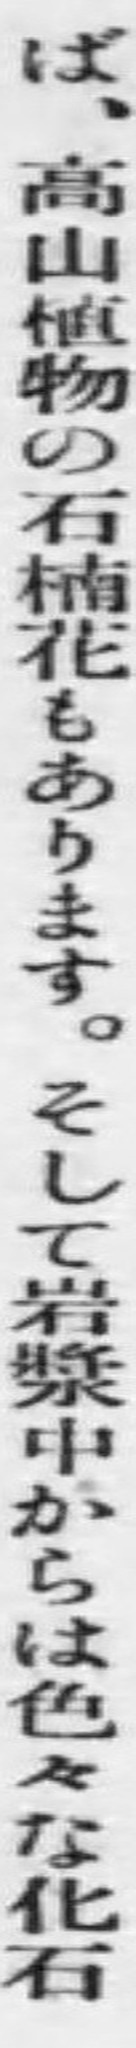ば、高山植物の石楠花もあります。そして岩漿中からは色々な化石
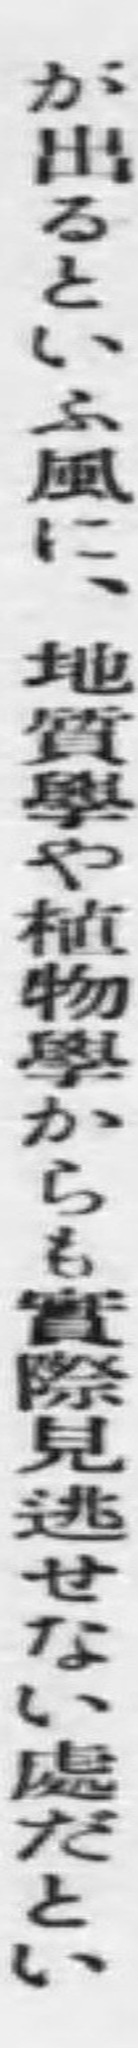が出るといふ風に、地質學や植物學からも實際見逃せない處だとい
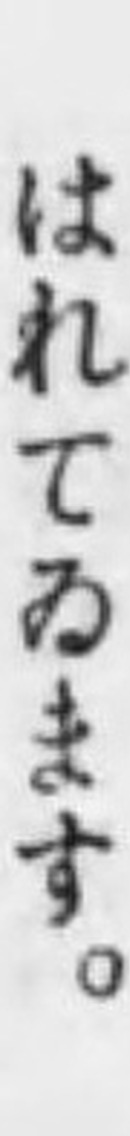はれてゐます。
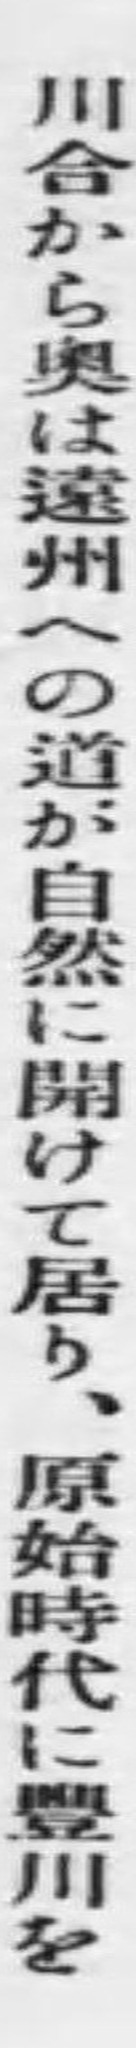川合から奥は遠州への道が自然に開けて居り、原始時代に豊川を
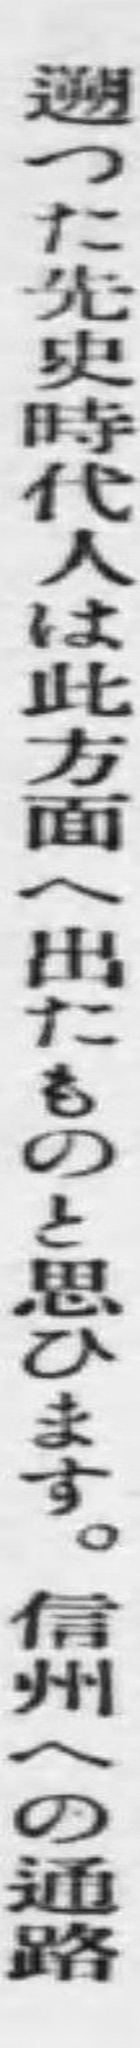遡つた先史時代人は此方面へ出たものと思ひます。信州への通路
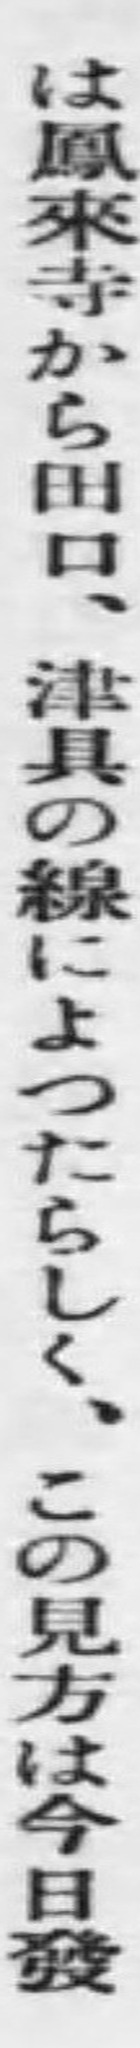は鳳來寺から田口、津具の線によつたらしく、この見方は今日發
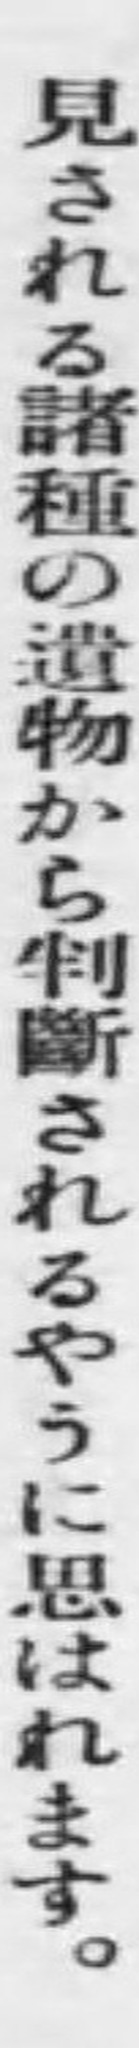見される諸種の遺物から判斷されるように思はれます。
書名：東三河道中記 : 豊橋市及其附近案内
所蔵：国立国会図書館 National Diet Library, JAPAN
